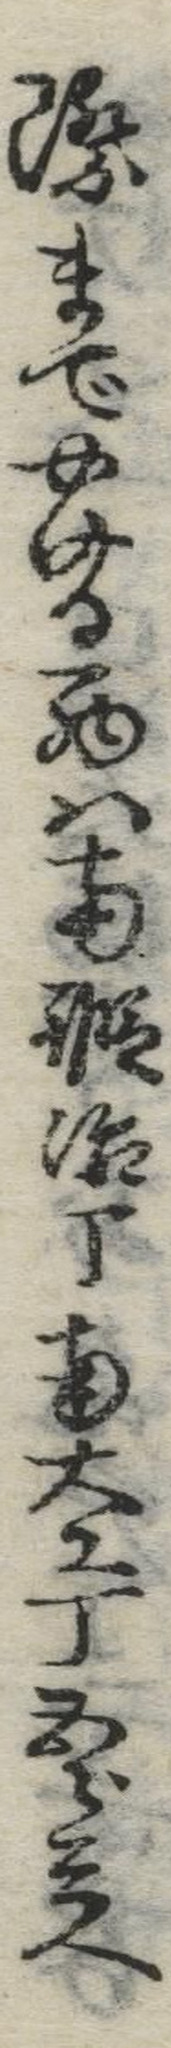際までやける西ハ南鍛冶丁南大工丁五郎兵へ
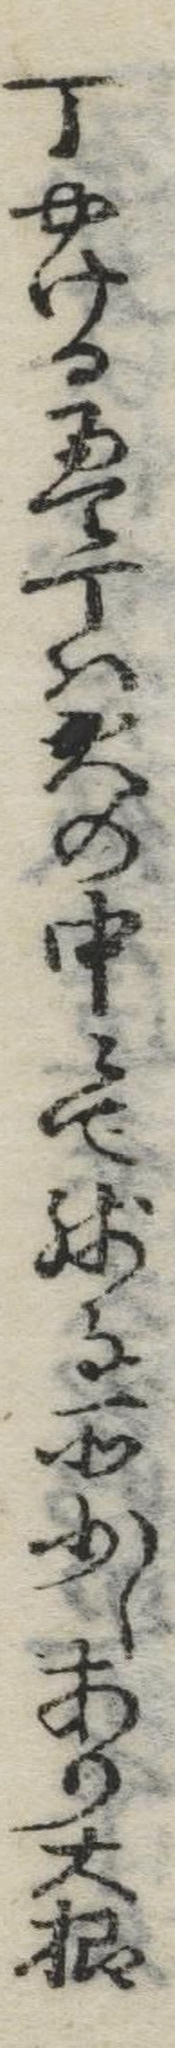丁やける畳丁ハ火の中にて残る所少しあり大根
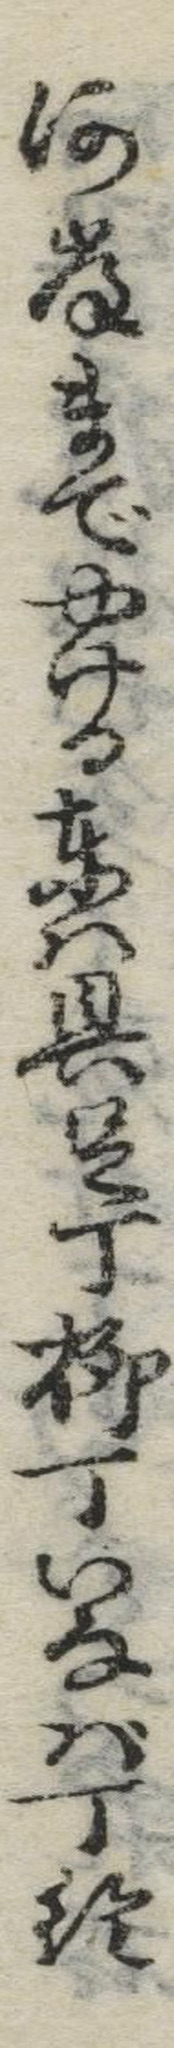河岸までやける東ハ具足丁柳丁いなバ丁鈴
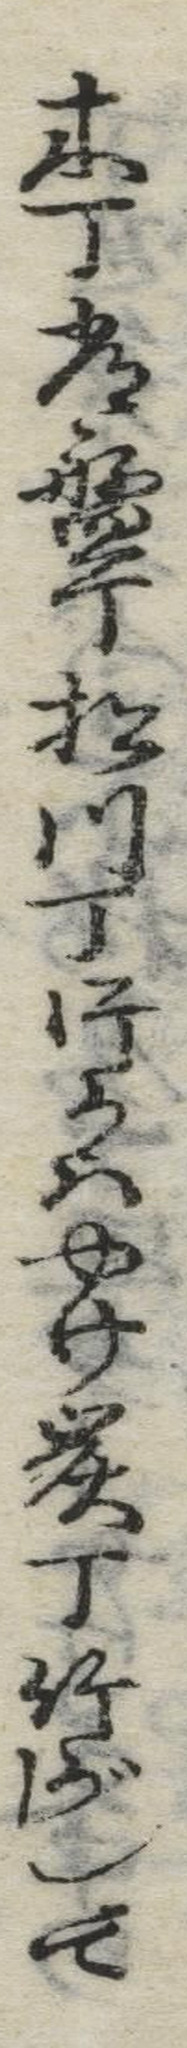木丁常盤丁松川丁片かハやけ炭丁竹がしにて
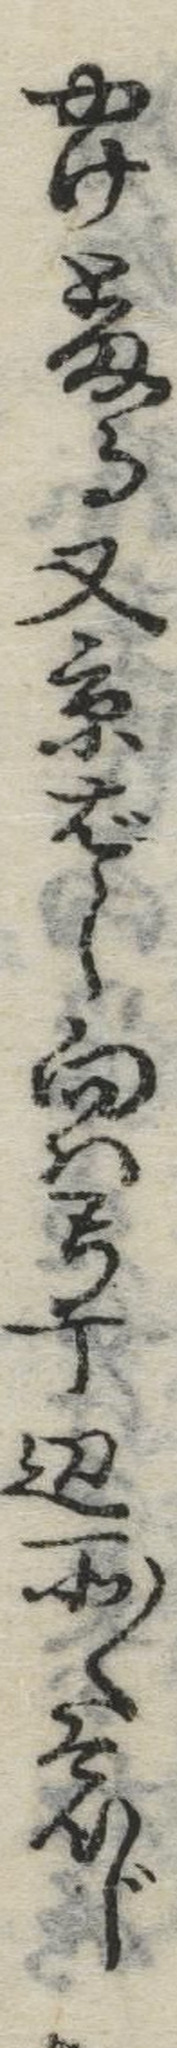やけとまる又京ばし向ハ弓丁辺所々そんじ
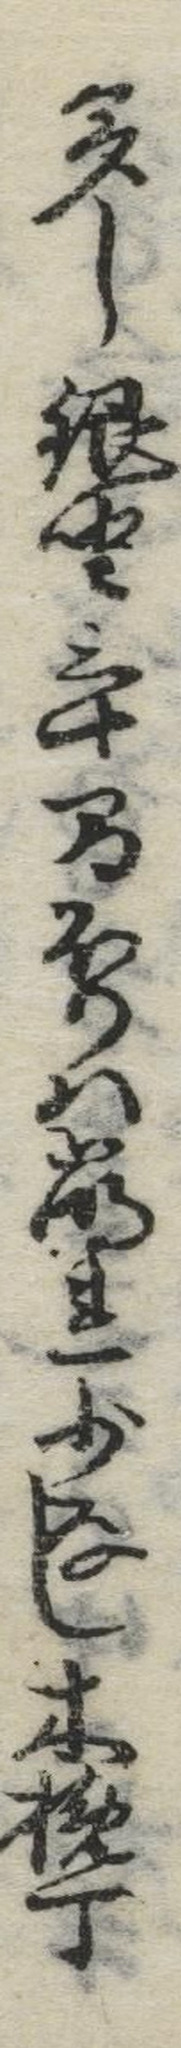多し銀座三十間ほりハ崩れ少なし木挽丁
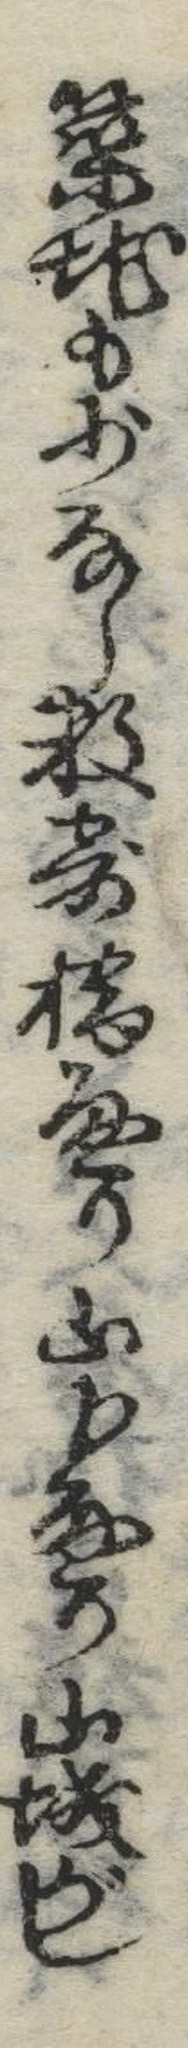築地も少なし数寄橋通り山下通り山城かし
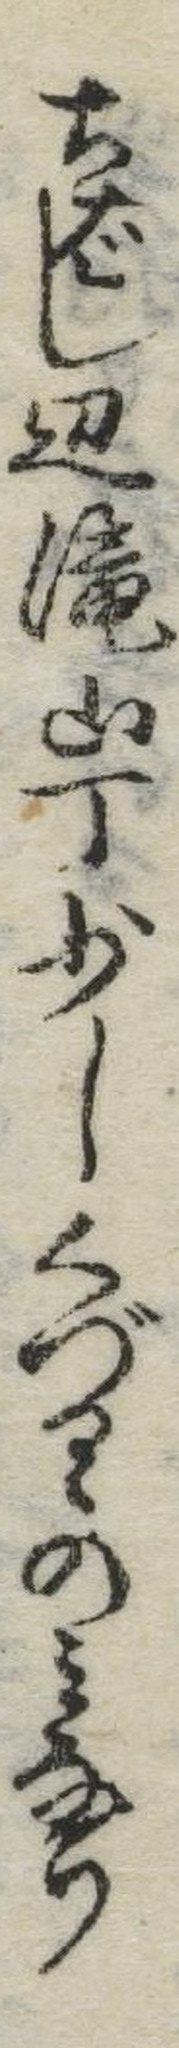土橋辺滝山丁少しくづるのミなり
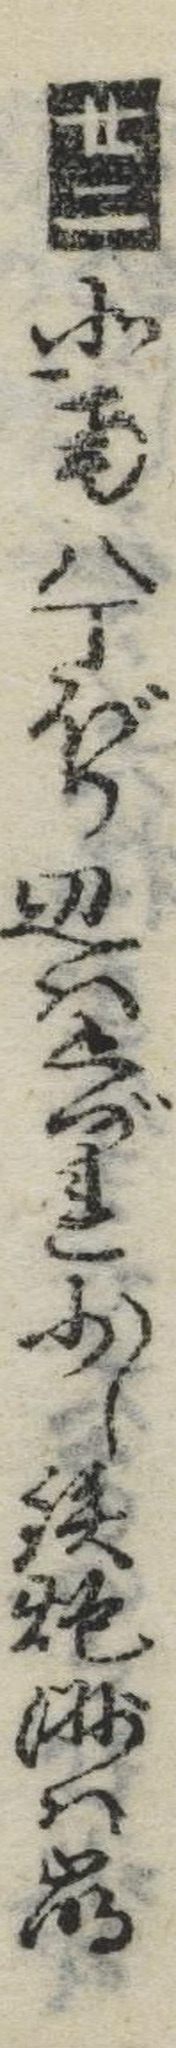廿二北南八丁ぼり辺ハくづれ少し鉄炮洲ハ崩
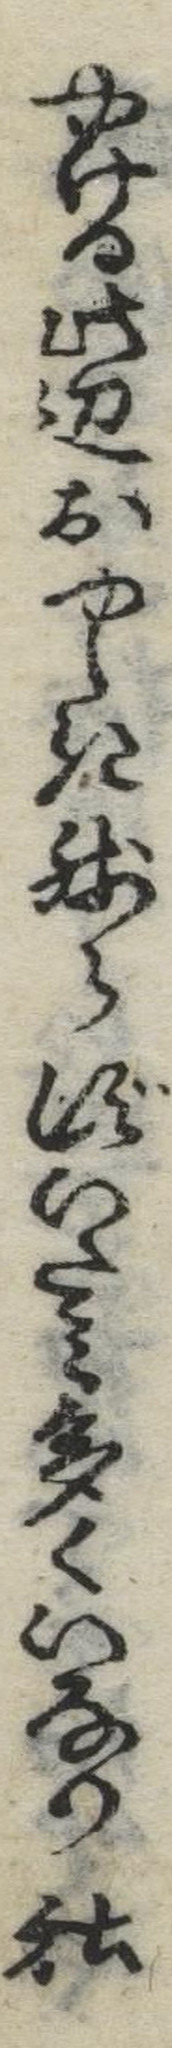やける此辺おやしき残らずいたミ多くいなり社
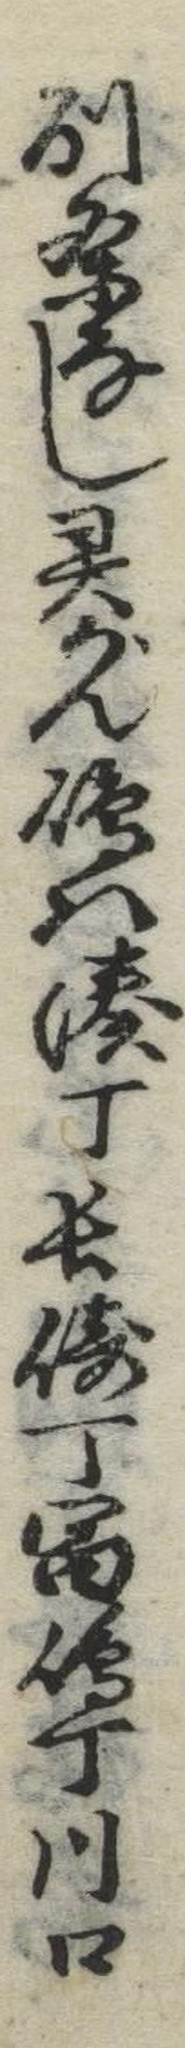別条なし灵かん嶋ハ湊丁長崎丁富嶋丁川口
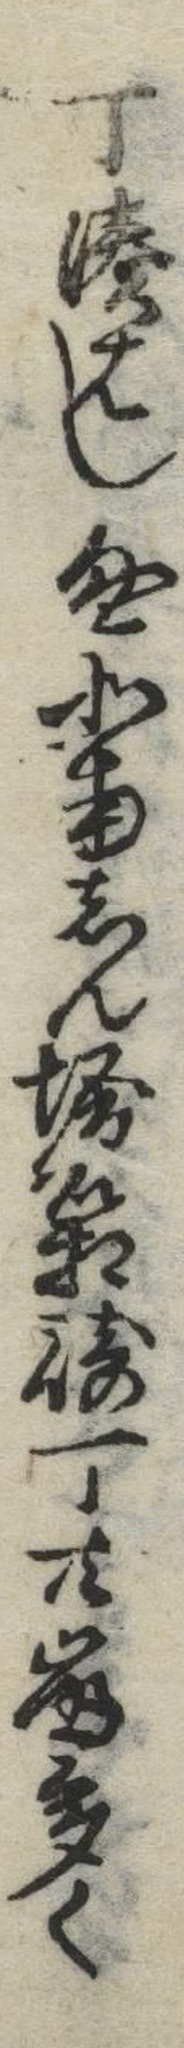丁湊はし通北南しん堀箱崎丁共崩多く

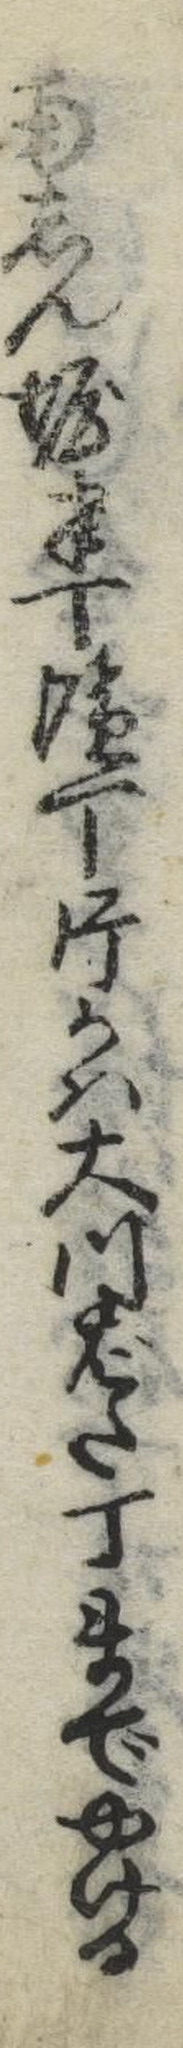南しん堀半丁塩丁片かハ大川ばた丁までやける
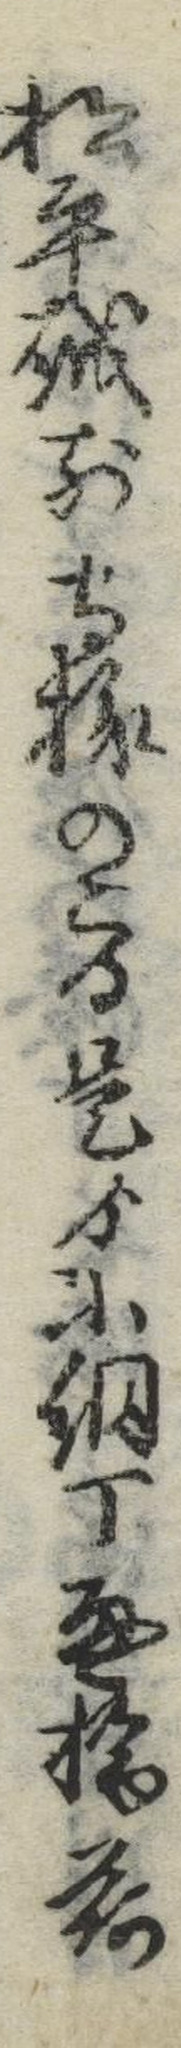松平越前守様のこる是ゟ小網丁通稲荷
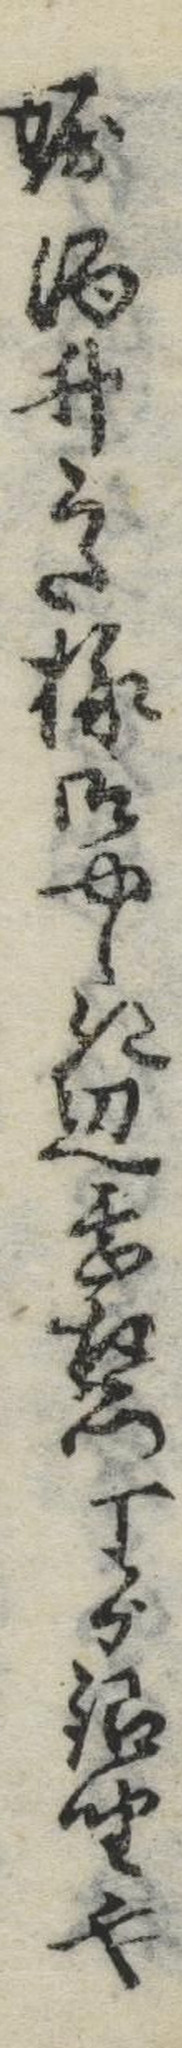堀酒井うた様御やしき辺甚左衛門町ゟ銀座や
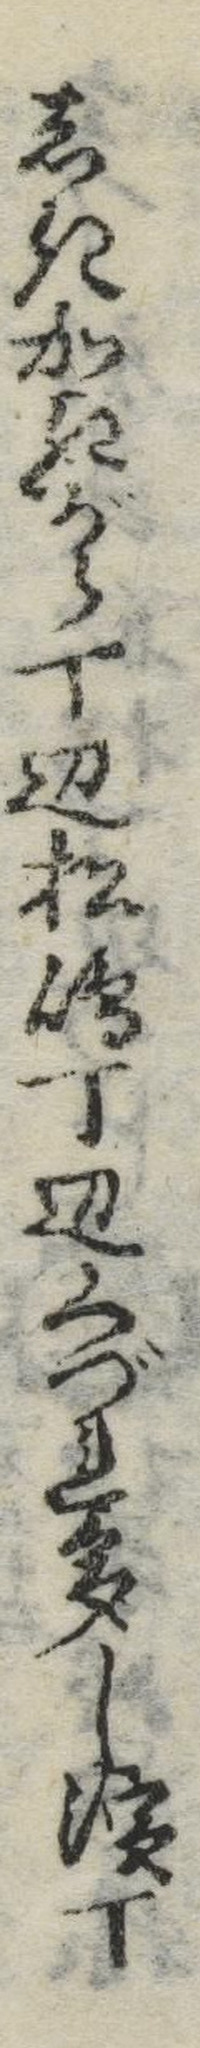しきかきうら丁辺松嶋丁辺くづれ多し浜丁
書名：安政二卯十月二日夜四ツ時過　御府内御屋敷方市中共　地震類焼場所明細書之寫　并街道筋近郷聞書
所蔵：東京大学地震研究所図書室 Earthquake Research Institute Library, The University of Tokyo, JAPAN
